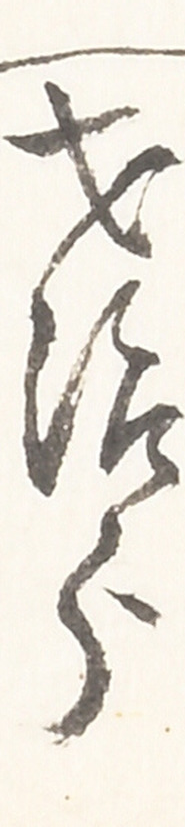才治郎
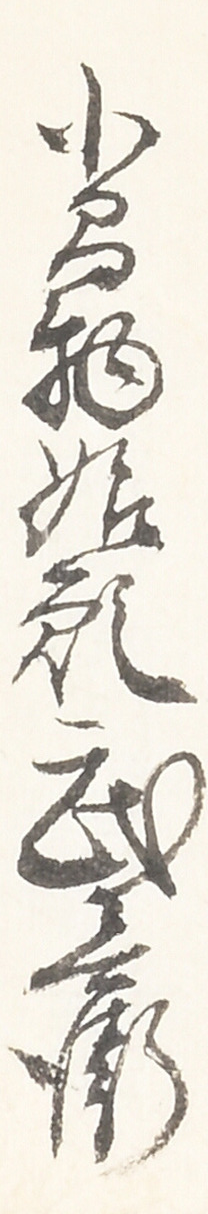小間物始願武兵衛
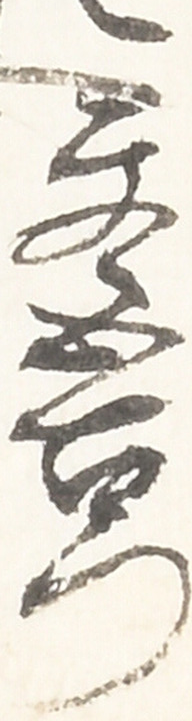文五右衛門
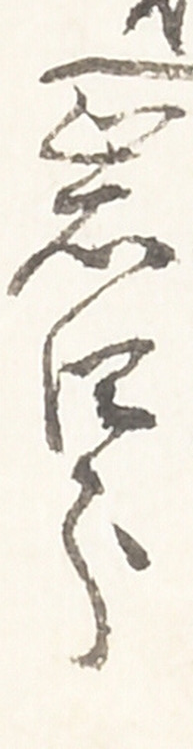岩四郎
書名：（諸運上控帳）
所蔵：伊那市立高遠町図書館・合同会社AMANE
